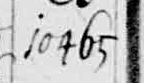10465
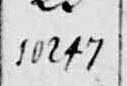10247
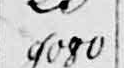9080
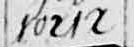10212
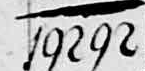19292
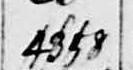4358
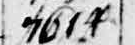7614
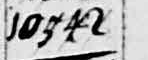10542
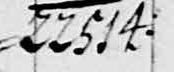22514
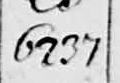6237
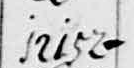12152-
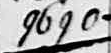9690
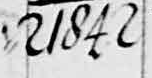21842
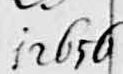12656
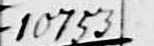10753
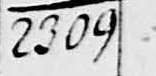2309
